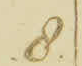8.
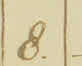8.
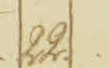22.
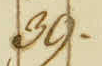39
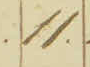11.
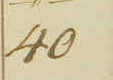40
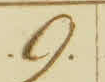9.
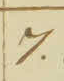7.
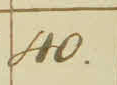40.
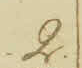2.
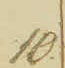10.
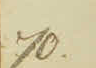70.
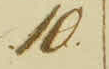10.
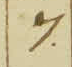7.
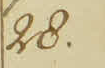28.
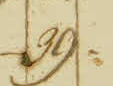39
